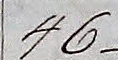46
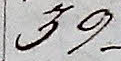39
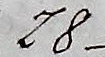28
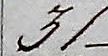31
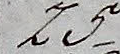25
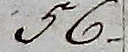56
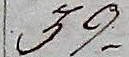39
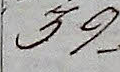39
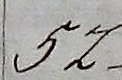52
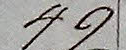49
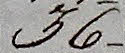36
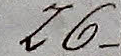26
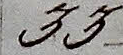33
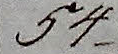54
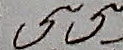55
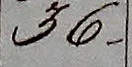36
